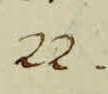22
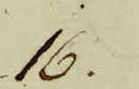16.
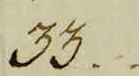33.
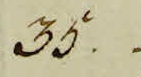35.
